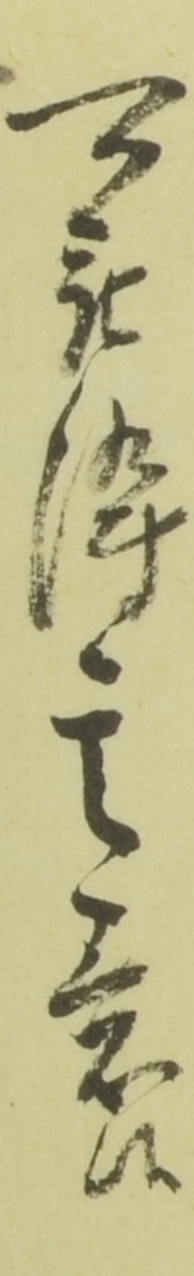可被得其意候
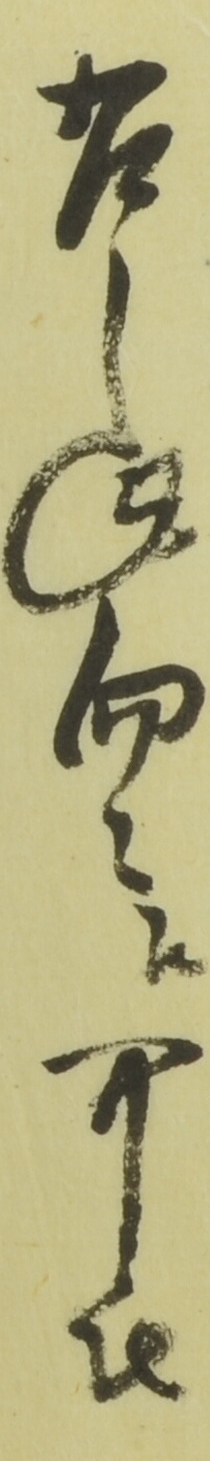右之趣向々江可被
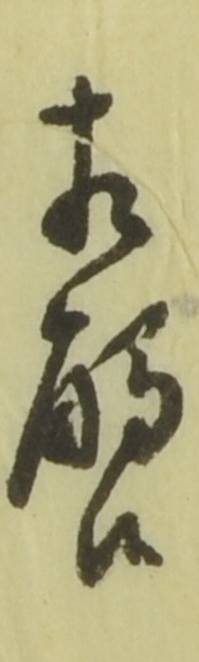相触候
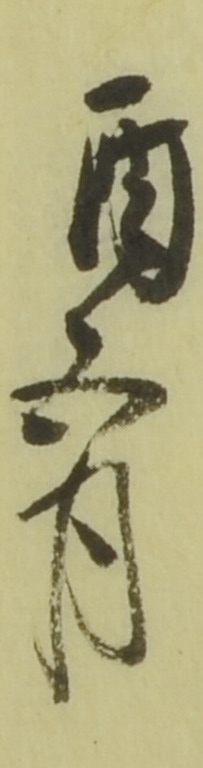酉五月
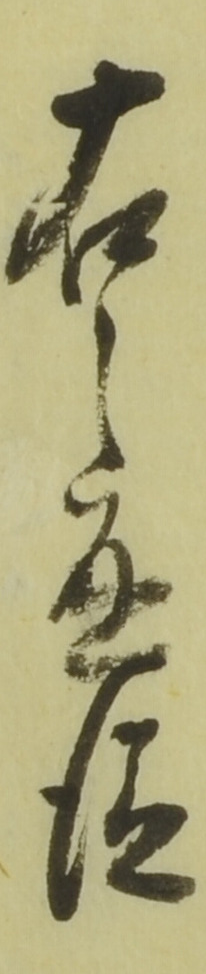右之通従
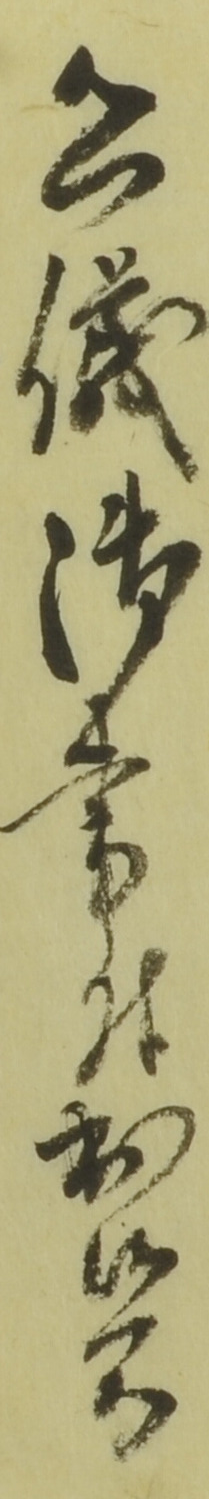公儀御書付出候間
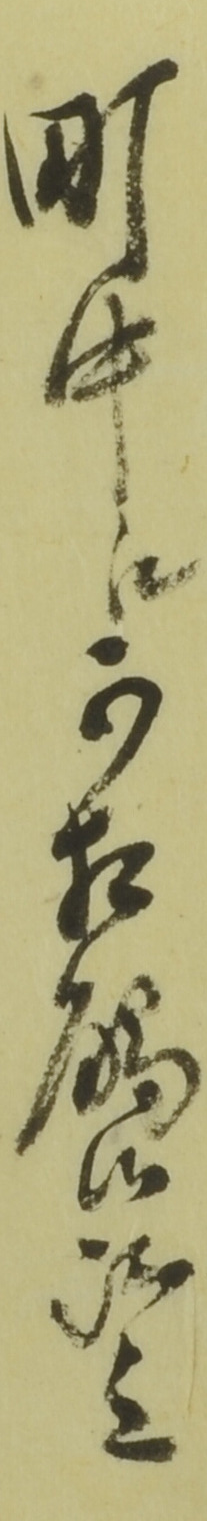町中江可相触候以上
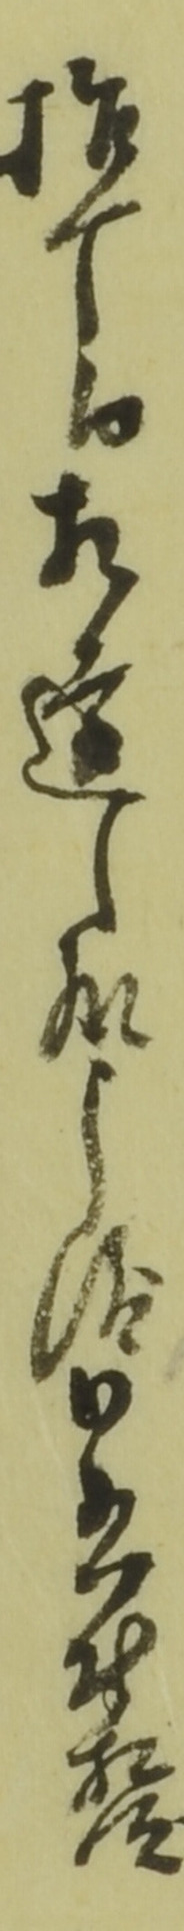拾丁江相達候様申渡御書付相渡
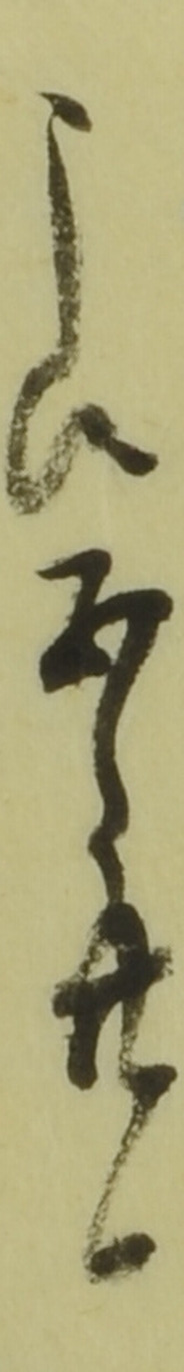申候五月廿日

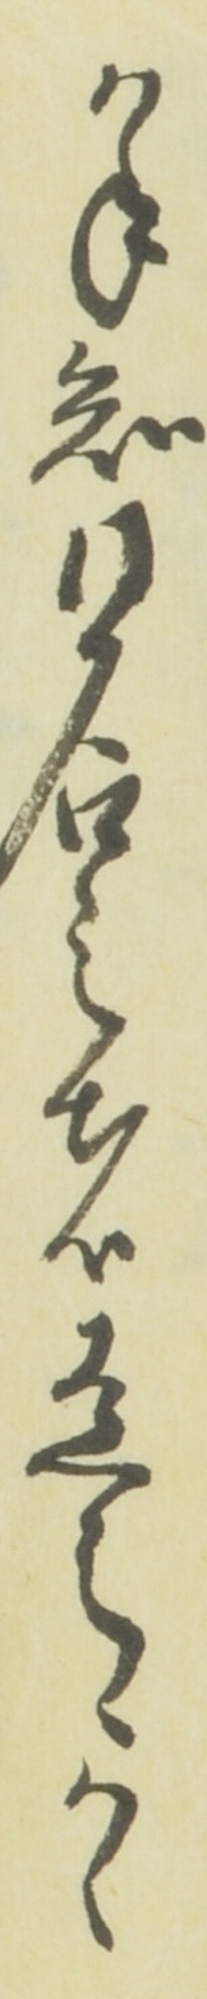承知同名之者有之候ハヽ
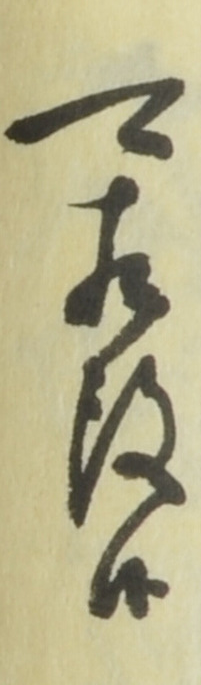可相改候
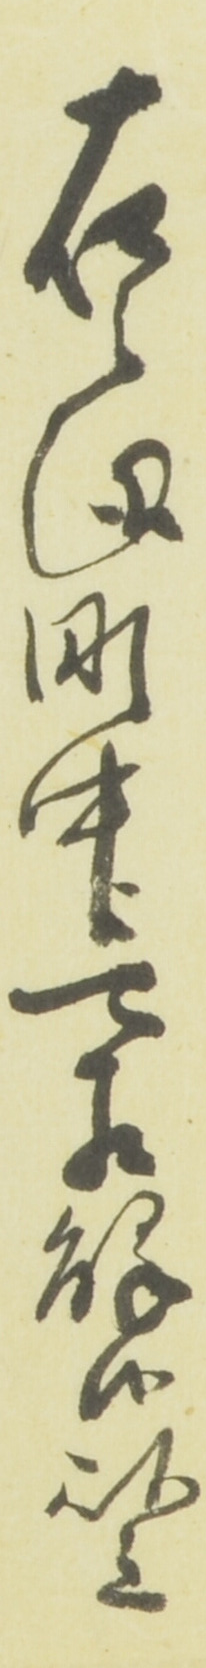右之趣町中江可相触候以上
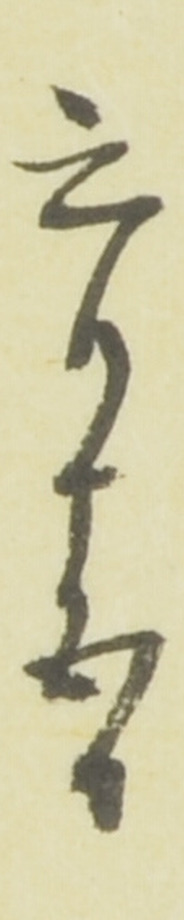六月十五日
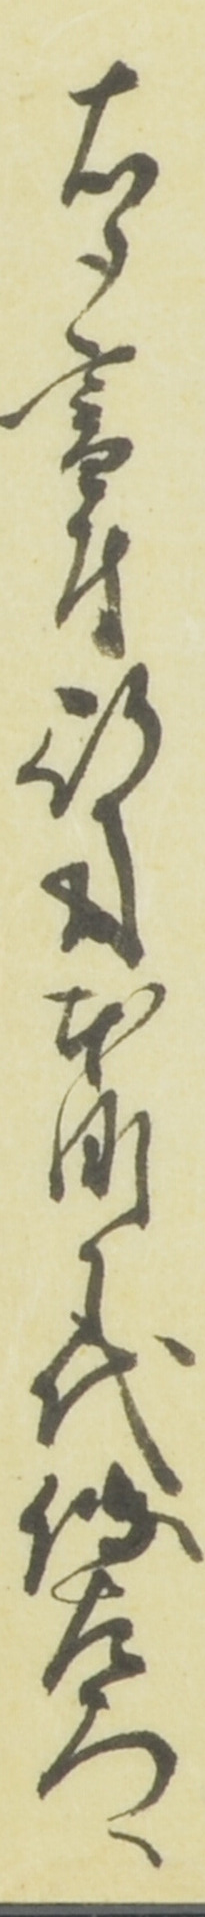右御書付行司本町丁代伝左衛門へ
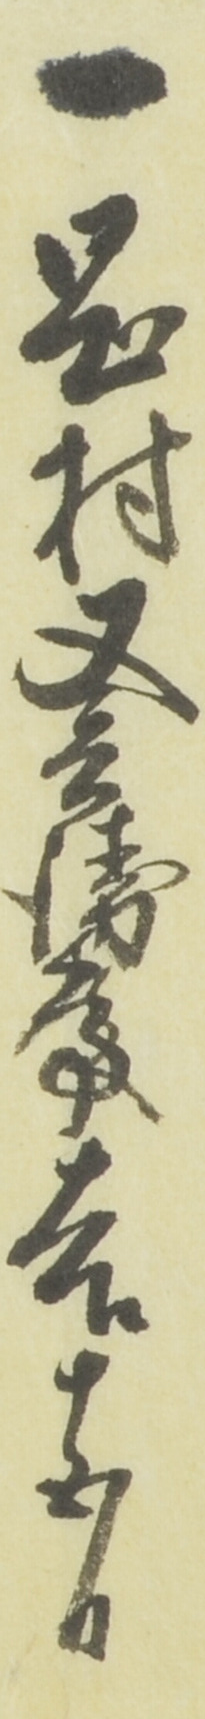一岡村又兵衛殿去ル十五日
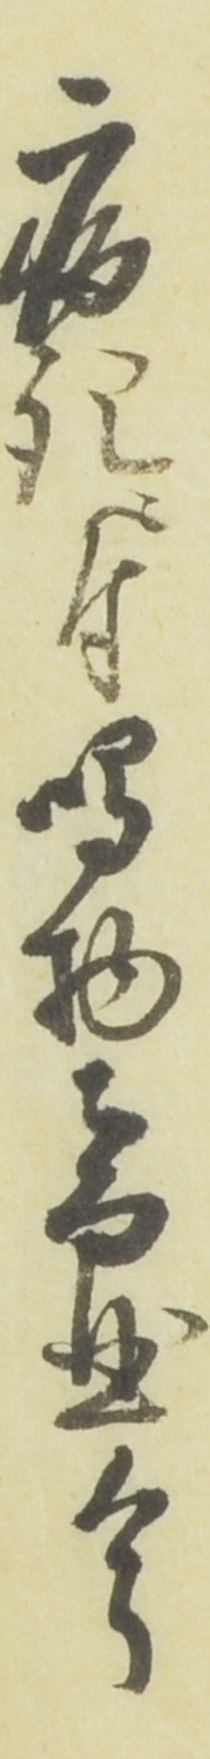病死ニ付鳴物音曲今日
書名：御触書御書附控
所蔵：伊那市立高遠町図書館・合同会社AMANE
